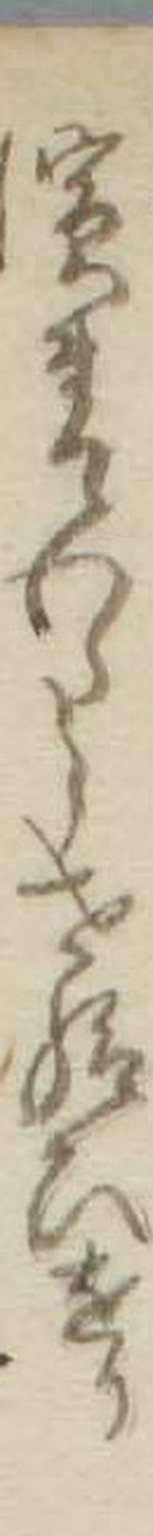浜まてわたらせ給ひをり
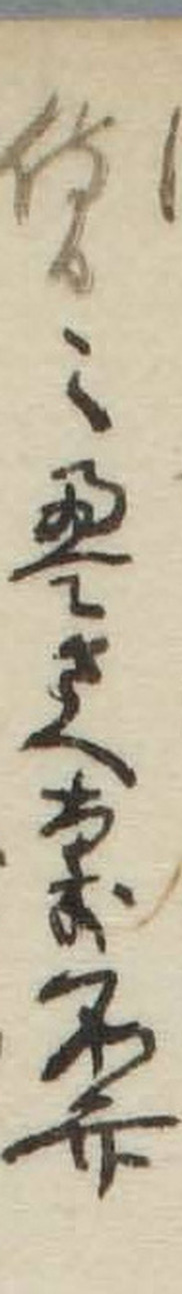侍る云々畳さへなき不弁
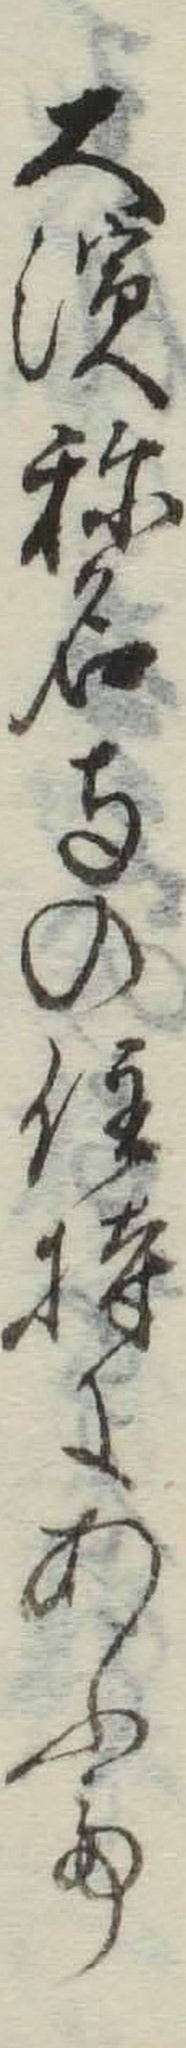大浜称名寺の住持にあふて
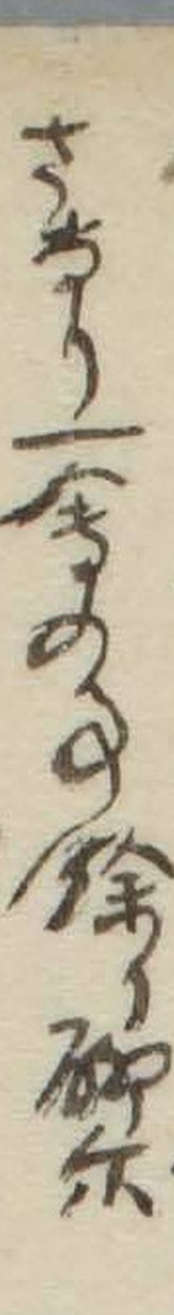さなり一会の事餘り聊爾
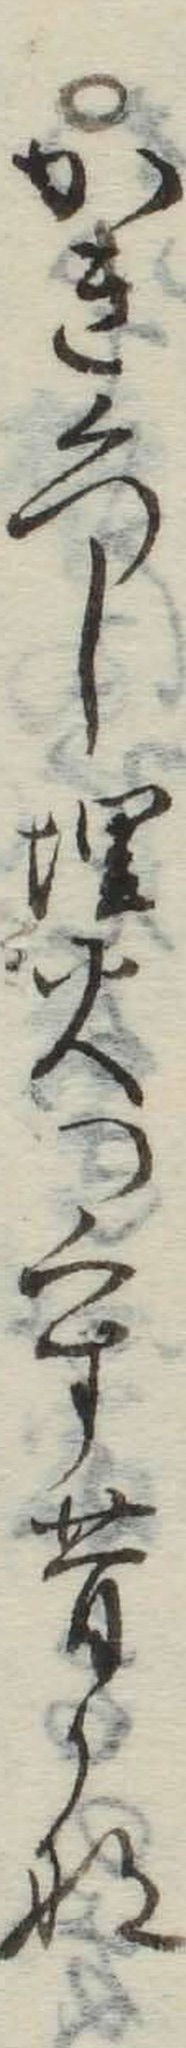かきくつし埋火つくす昔かな同
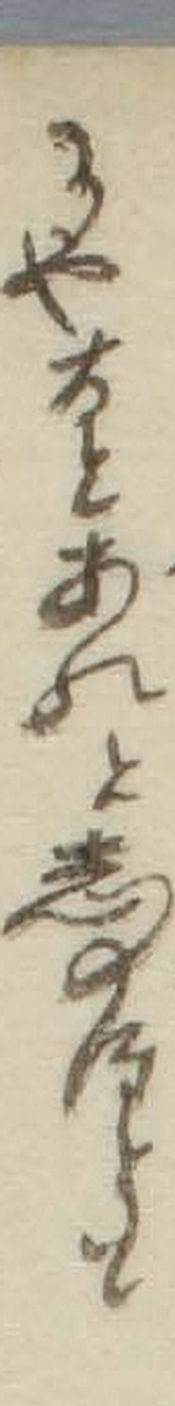にやなとあれと志のほとも
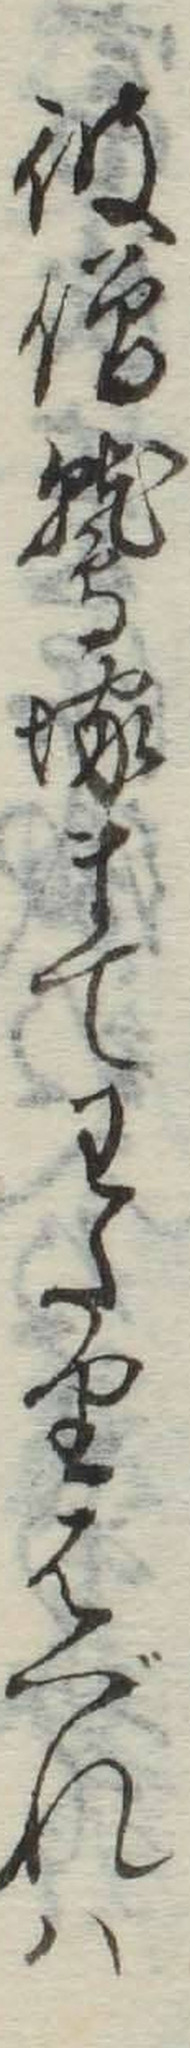彼僧鷲塚まてわたりはべれは
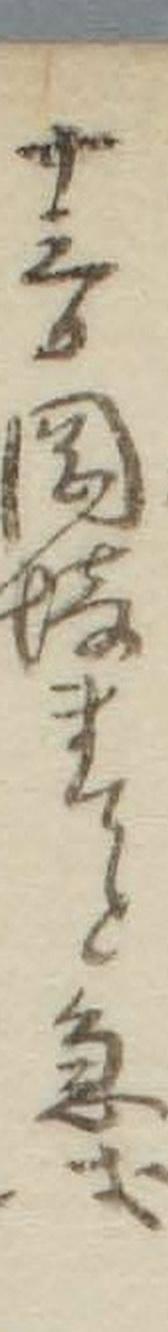十三日岡崎まてと急き
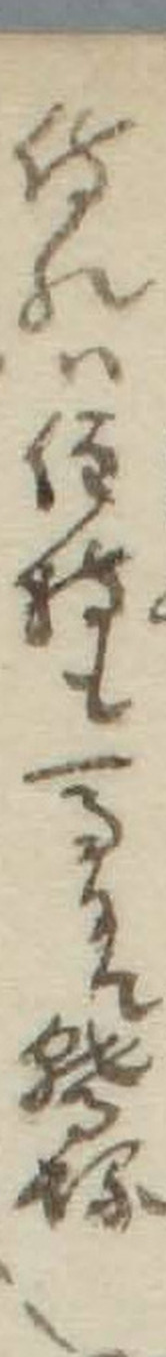侍れは住持と馬にて鷲塚
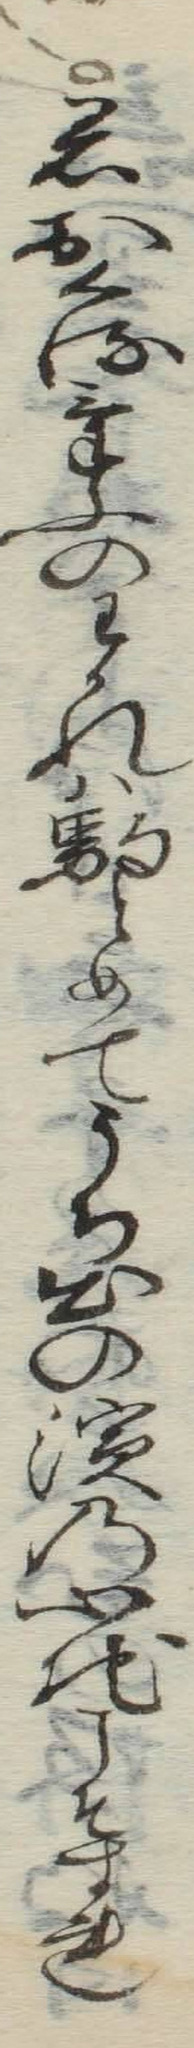君おくるけふのわかれは駒とめてうち出の浜の心地こそすれ
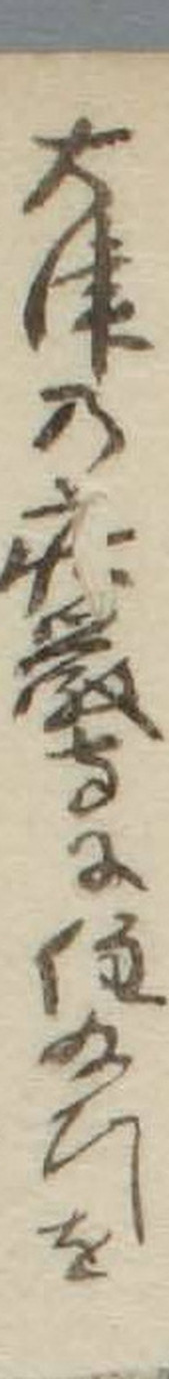大津の荘厳寺に住給ひしを
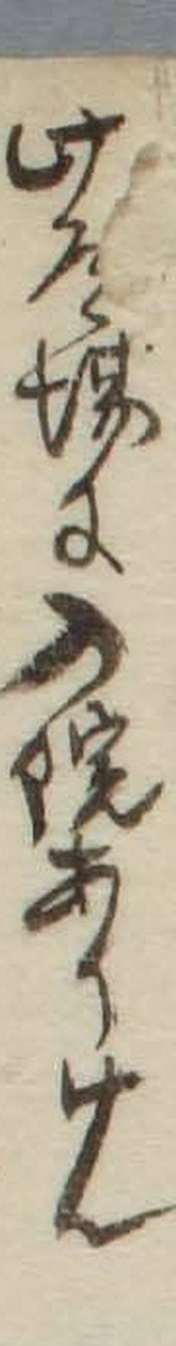此道場に入院ありけん
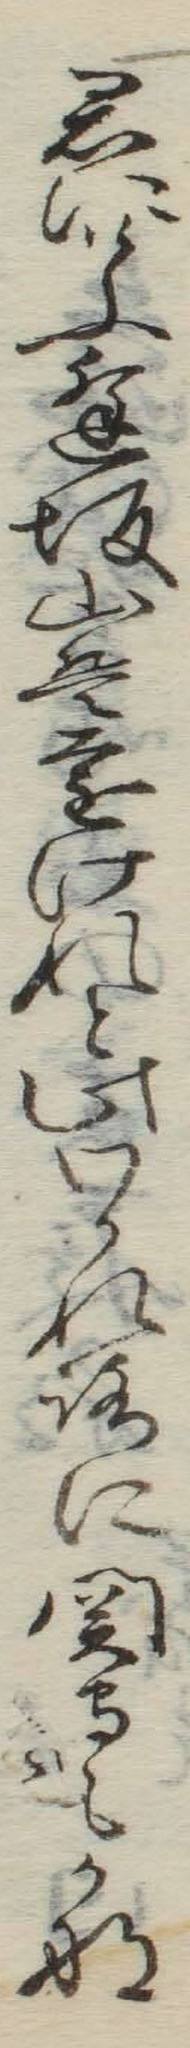君にけふ逢坂山は遠けれと此わかれ路に関守もかな
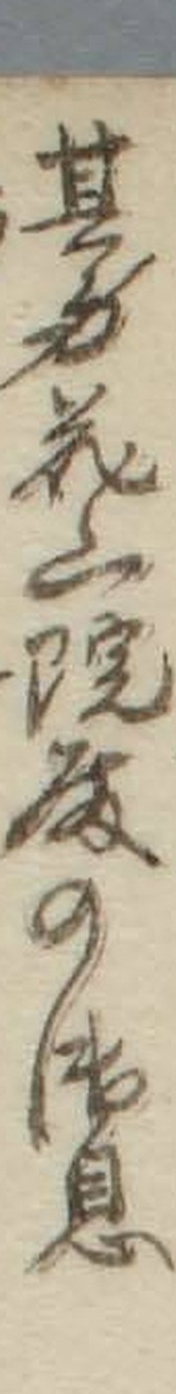其身花山院殿の御息
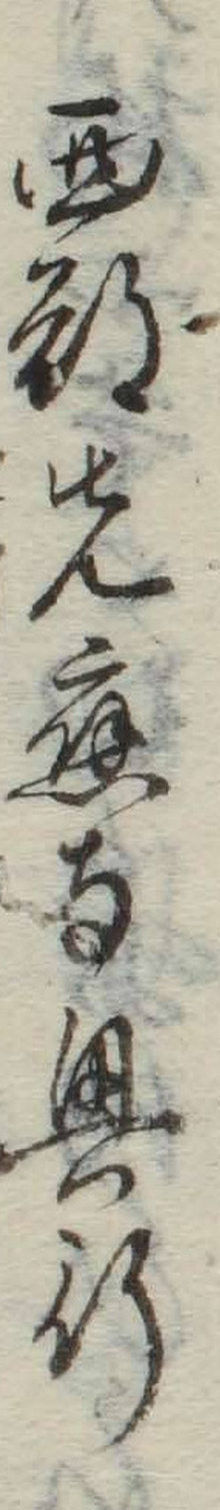西都先應寺興行
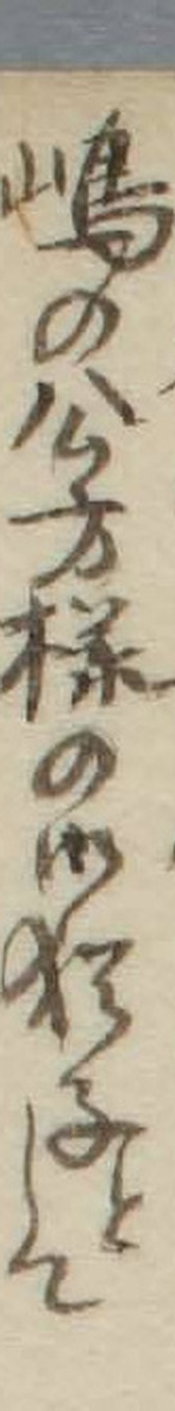嶋の公方様の御猶子として
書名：三河国二葉松
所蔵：国文学研究資料館
